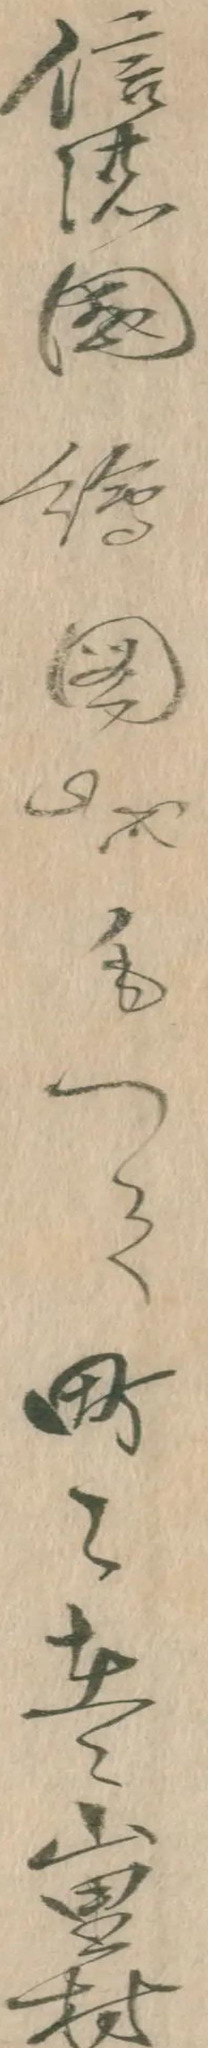信濃国絵図をもつて町々在々山里村
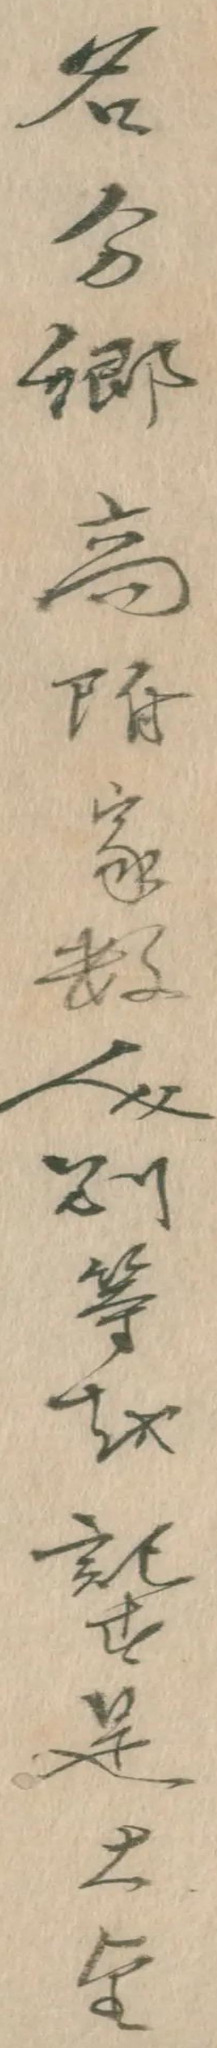名分郷高附家数人別等を記す是大金
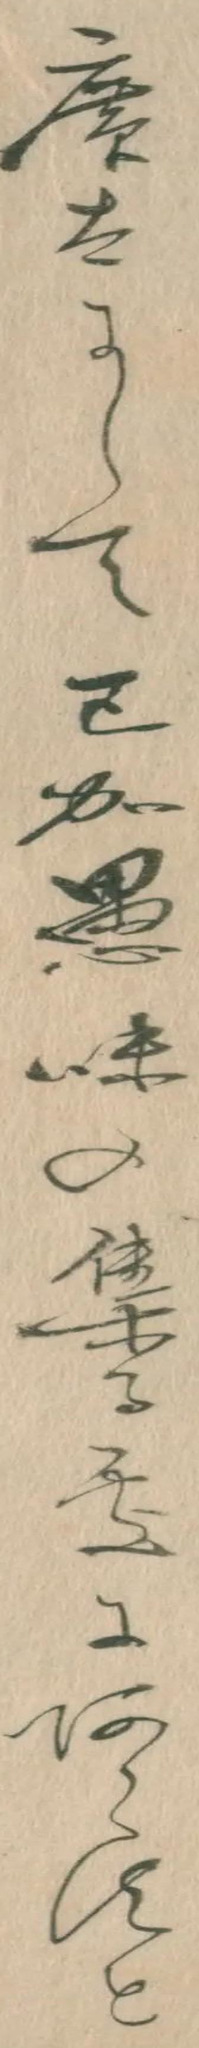広太にしてわか愚昧の集る處にあらすと
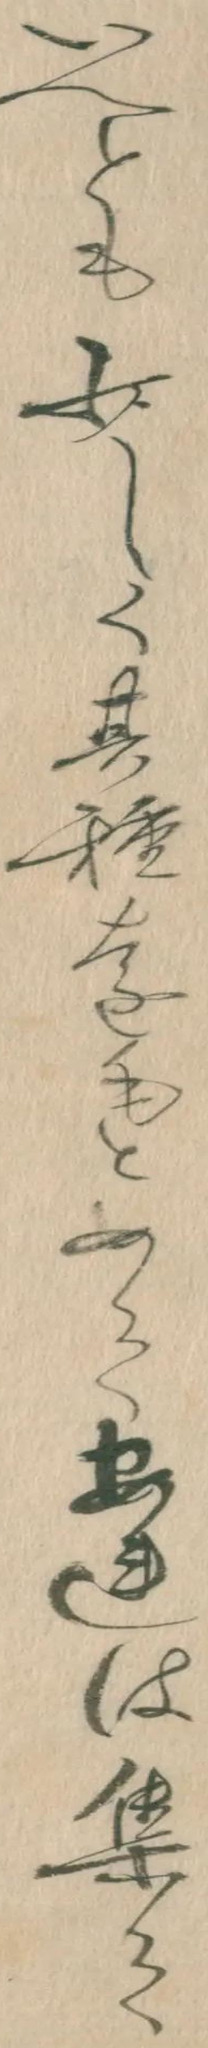いへとも少しく其種をもとめてあれは集て
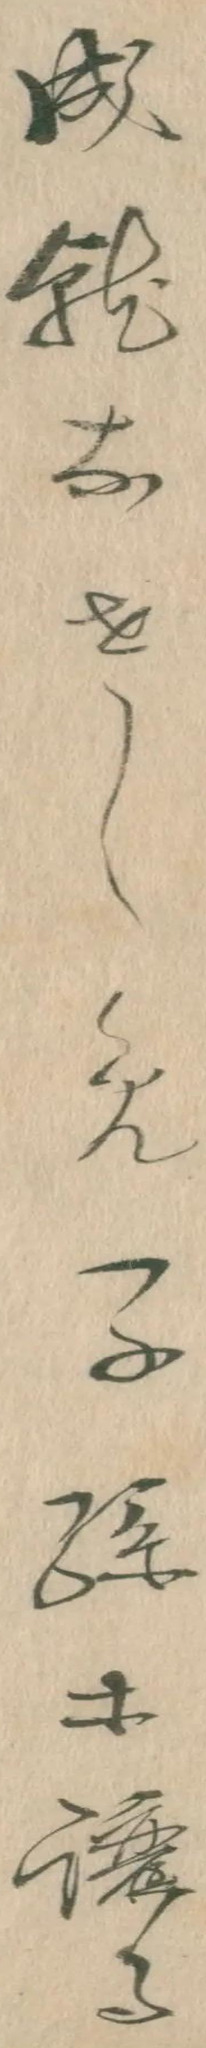成就なせしめ子孫等譲る
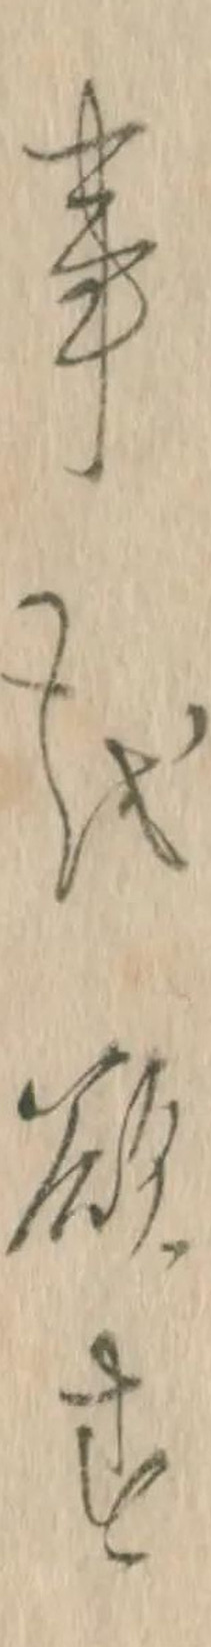事を欲す

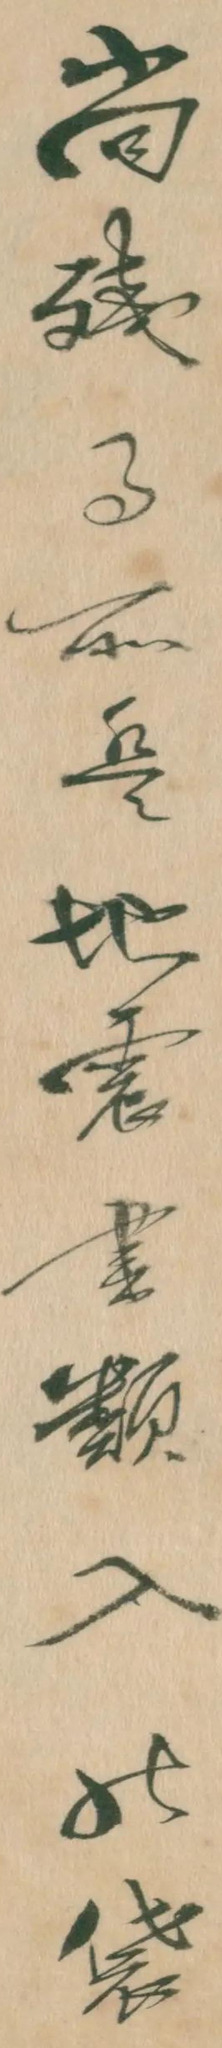尚残る所は地震書類入の袋
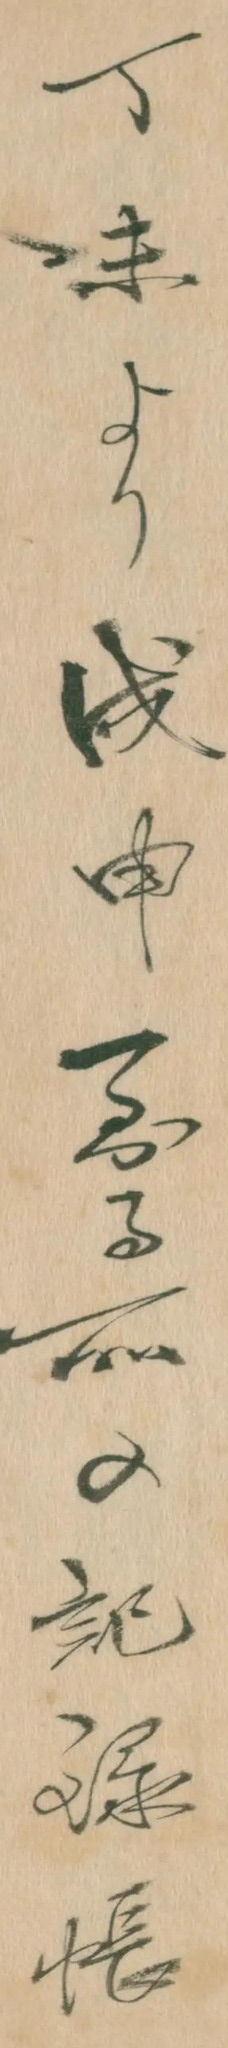丁未より戊申至る所の記録帳
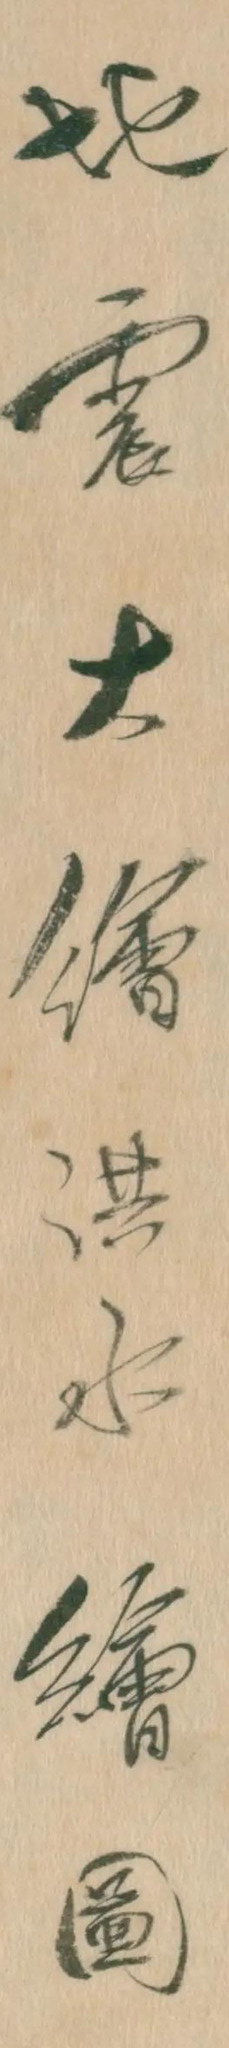地震大絵洪水絵図
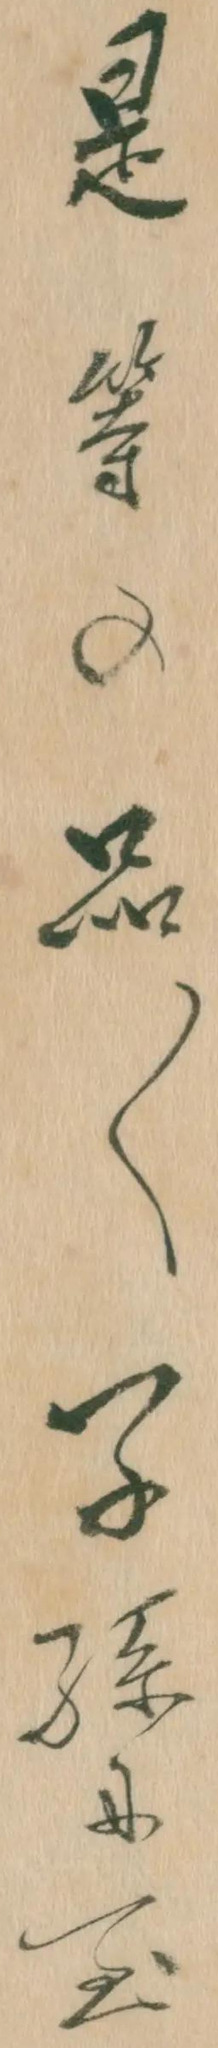是等の品〳〵子孫に至
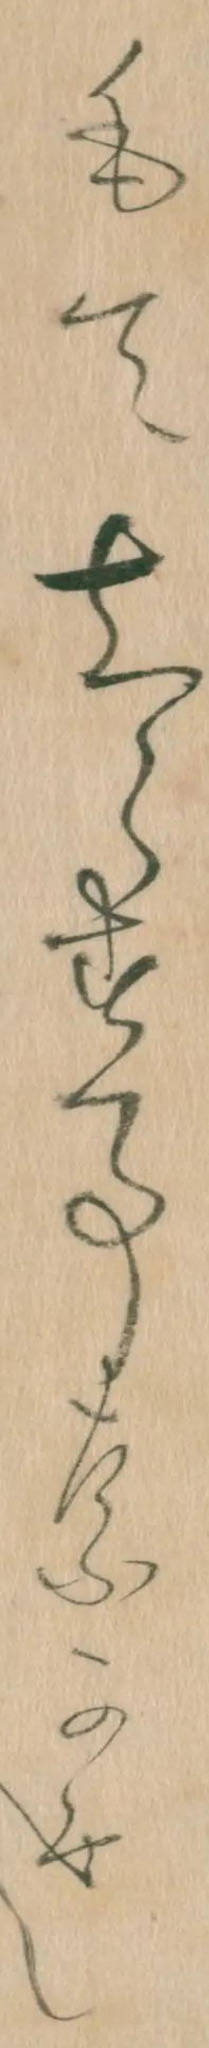もてちらす事なかし
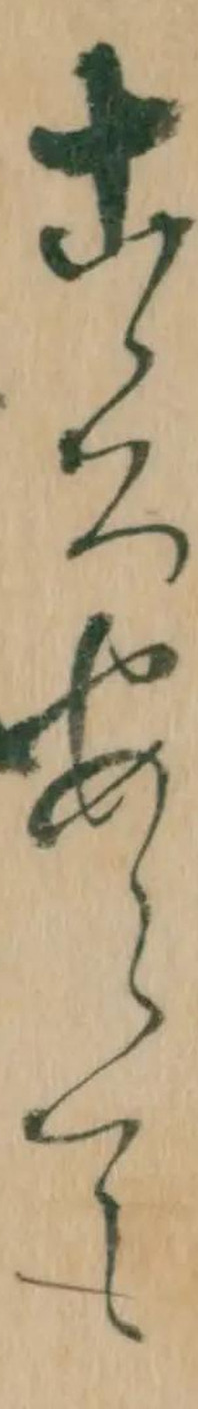こゝろあらて
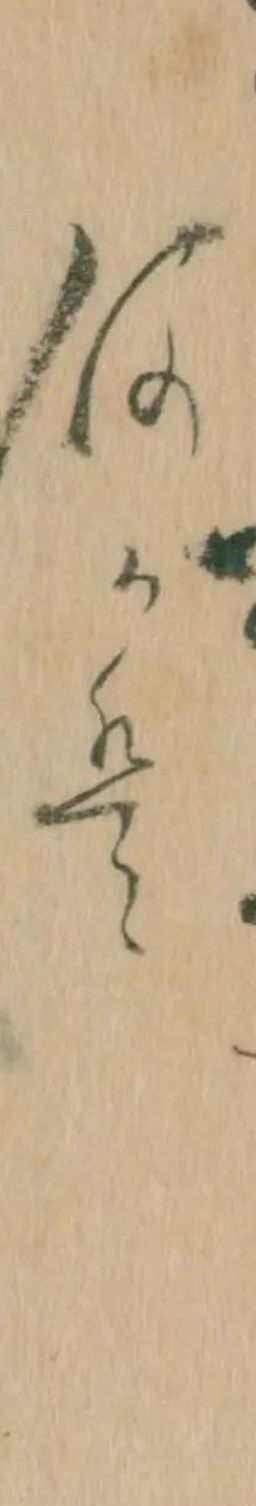何かは
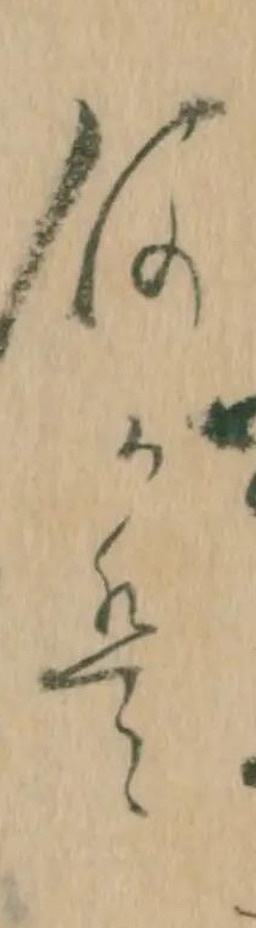何かは
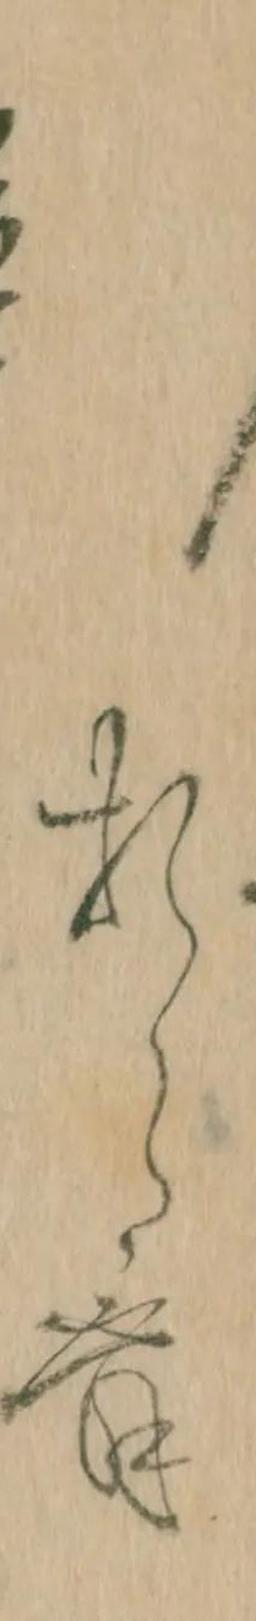折らむ
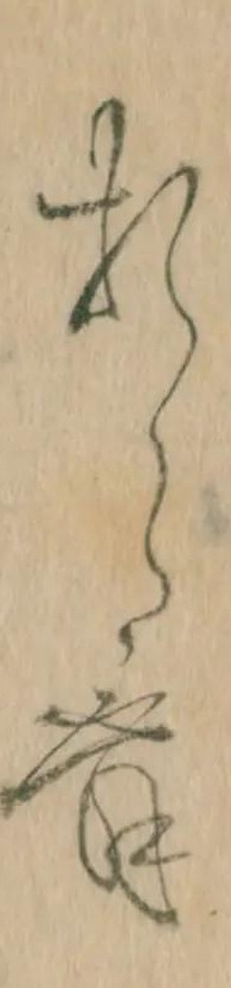折らむ
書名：俗語之種. [7]
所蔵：国立国会図書館 National Diet Library, JAPAN
